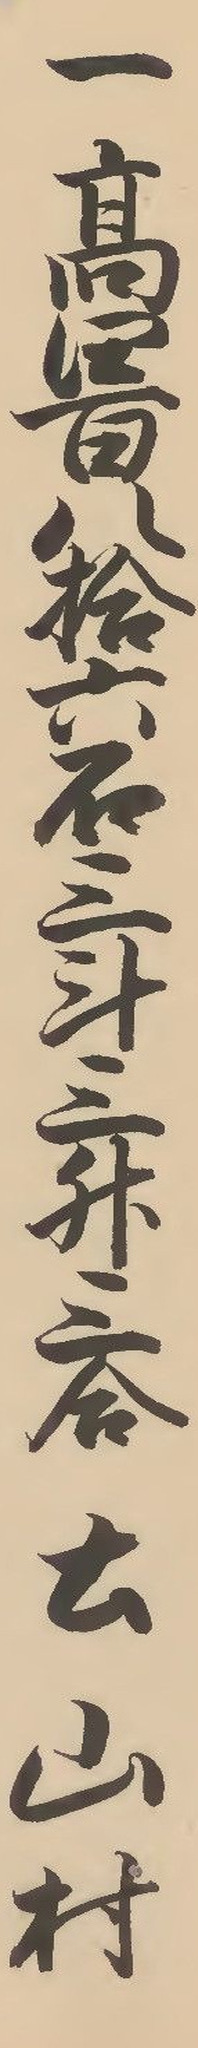一髙四百八拾六石三斗三升三合土山村
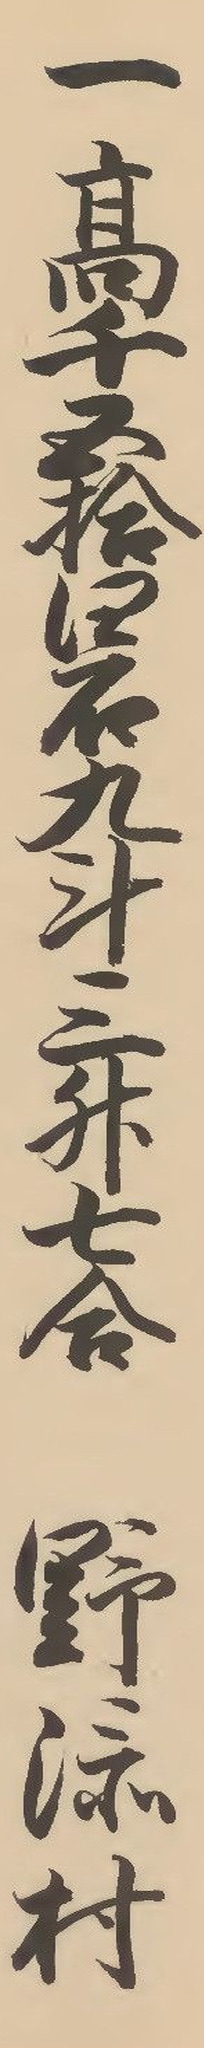一髙千五拾四石九斗三升七合野添村
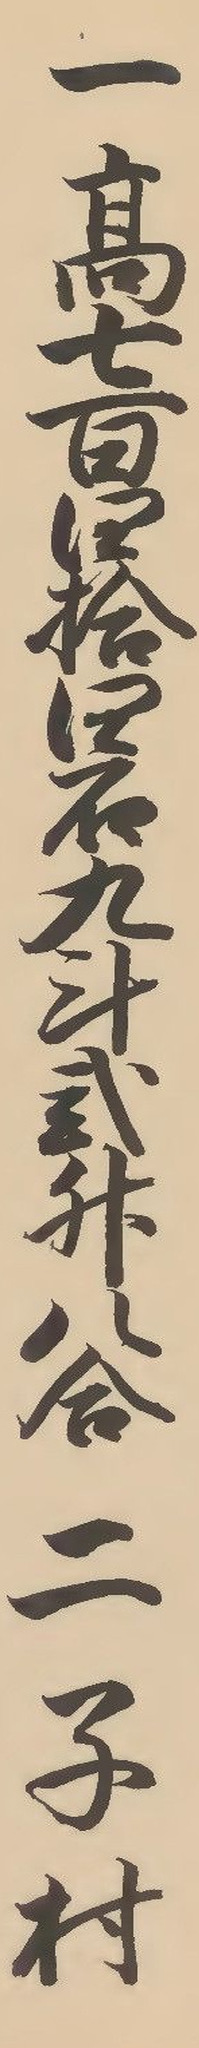一髙七百四拾四石九斗弐升八合二子村
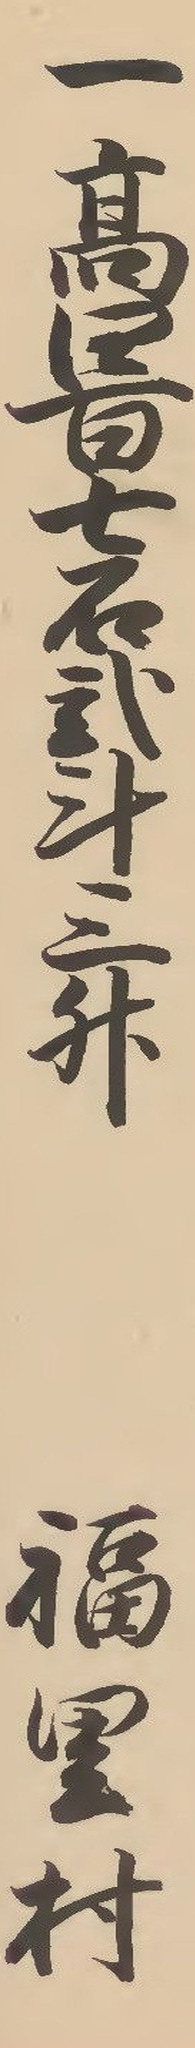一髙四百七石弐斗三升福里村
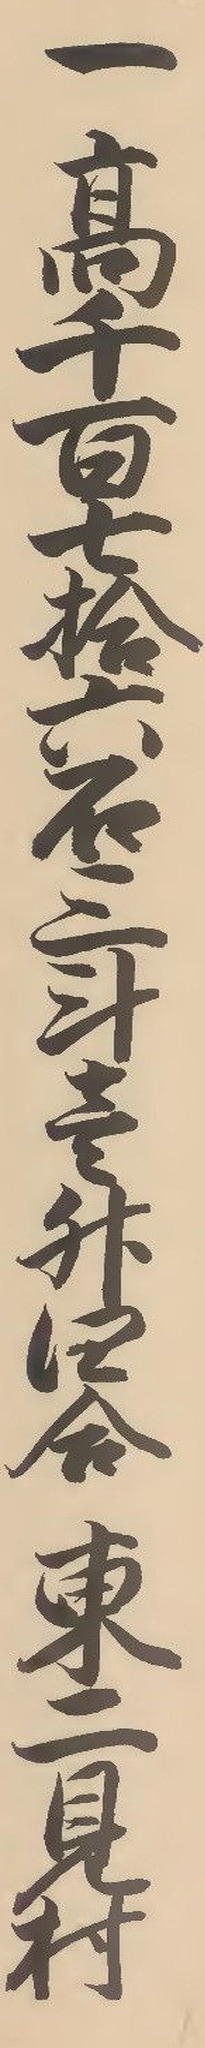一髙千百七拾六石三斗壱升四合東二見村
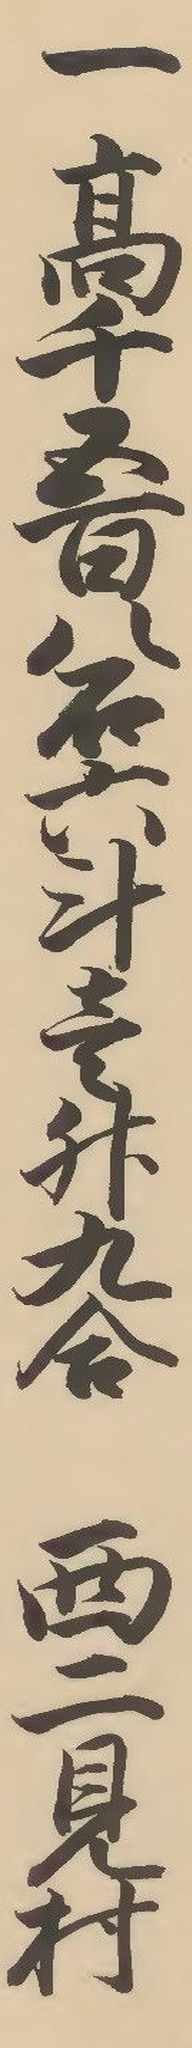一髙千五百八石六斗壱升九合西二見村
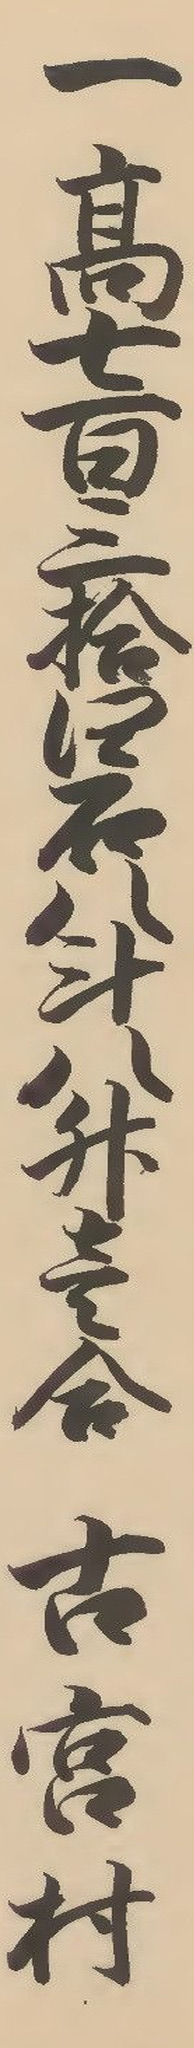一髙七百三拾四石八斗八升壱合古宮村
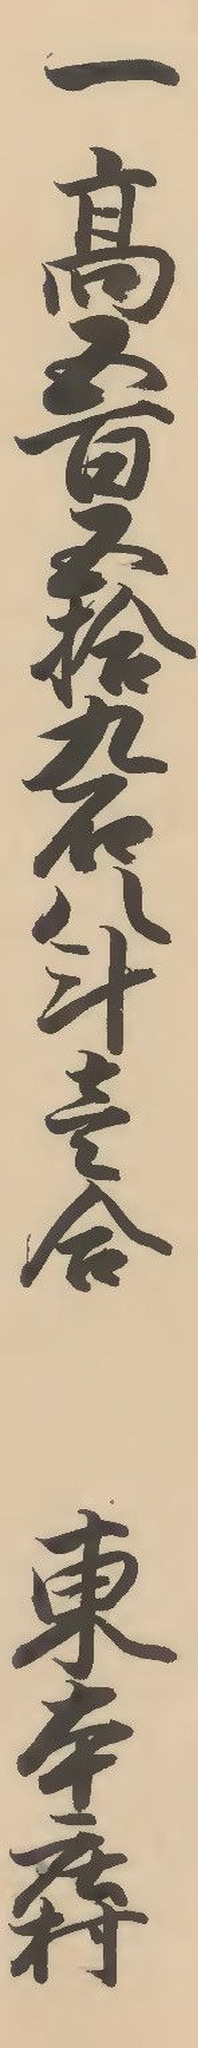一髙五百五拾九石八斗壱合東本庄村

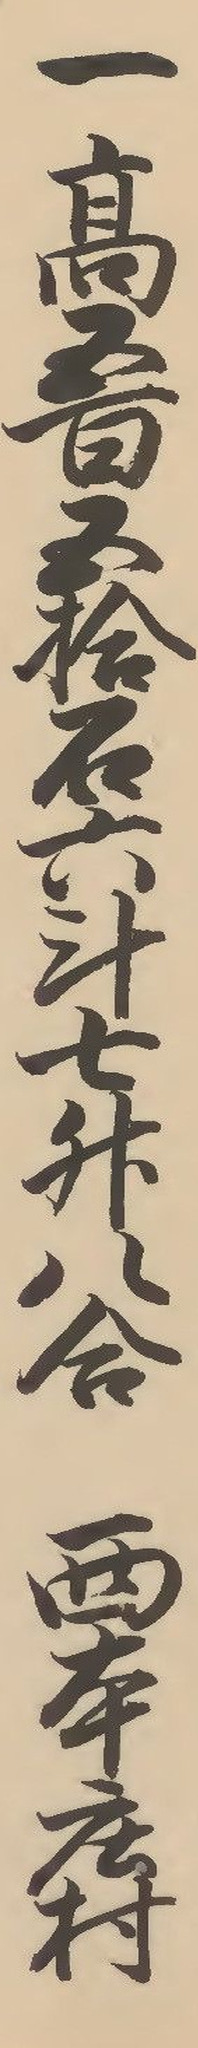一髙五百五拾石六斗七升八合西本庄村
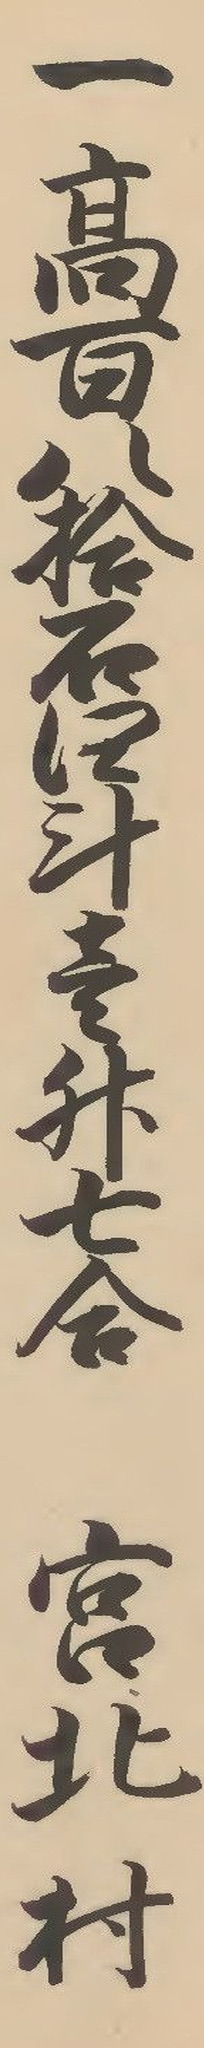一髙百八拾石四斗壱升七合宮北村
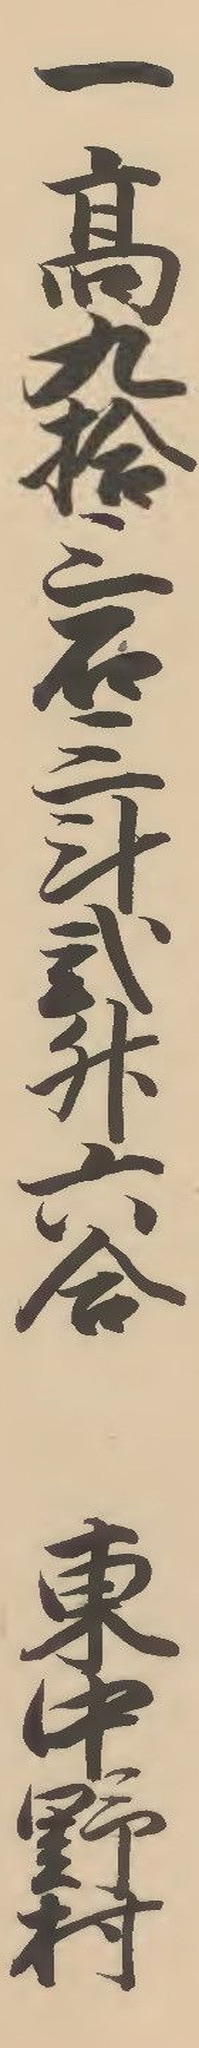一髙九拾三石三斗弐升六合東中野村
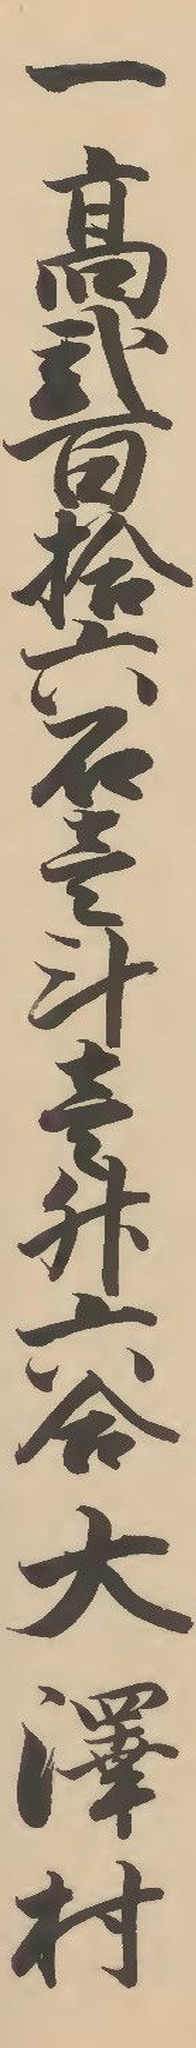一髙弐百拾六石壱斗壱升六合大澤村
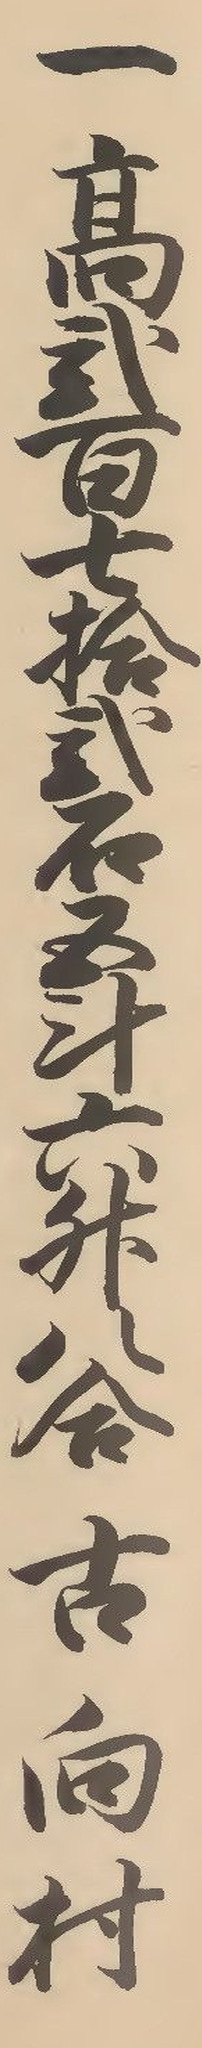一髙弐百七拾弐石五斗六升八合古向村
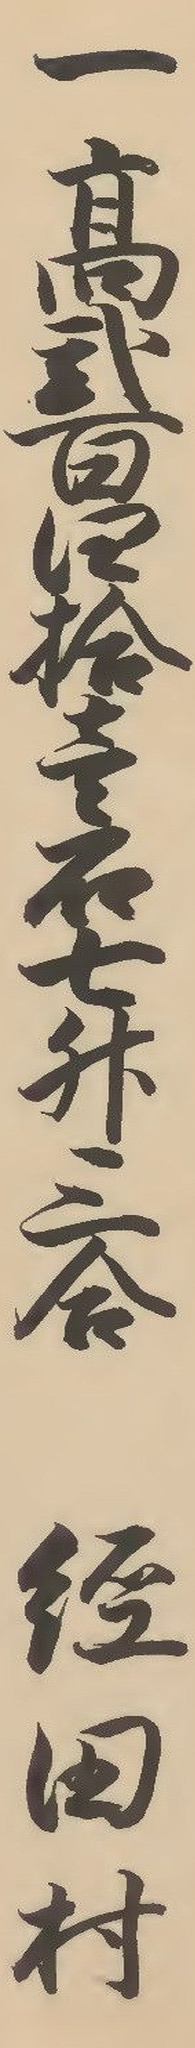一髙弐百四拾壱石七升三合經田村
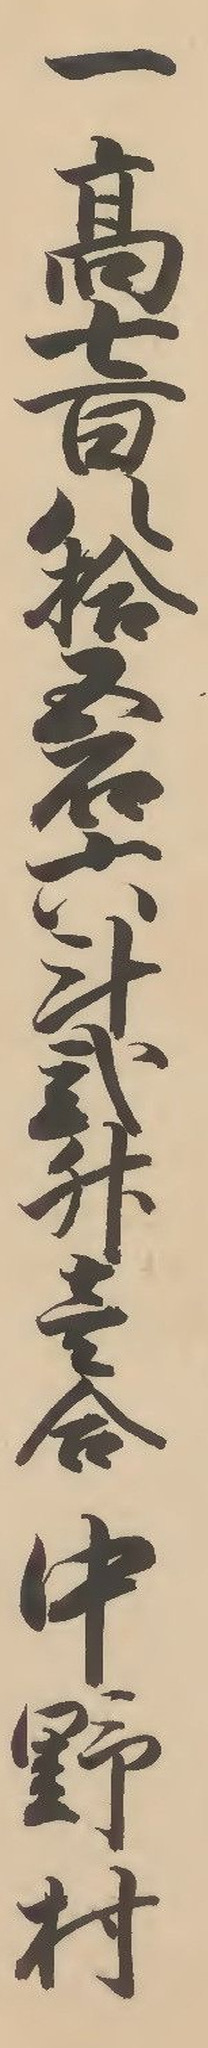一髙七百八拾五石六斗弐升壱合中野村
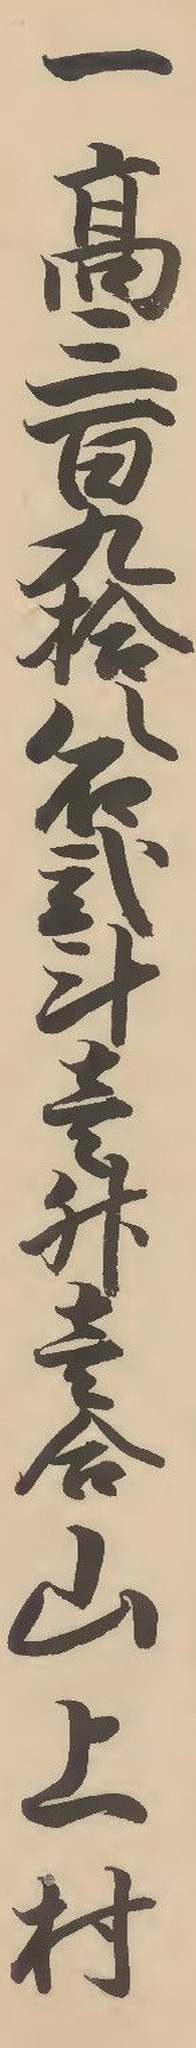一髙三百九拾八石弐斗壱升壱合山上村
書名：播磨国郷帳
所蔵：国立公文書館 National Archives of Japan
